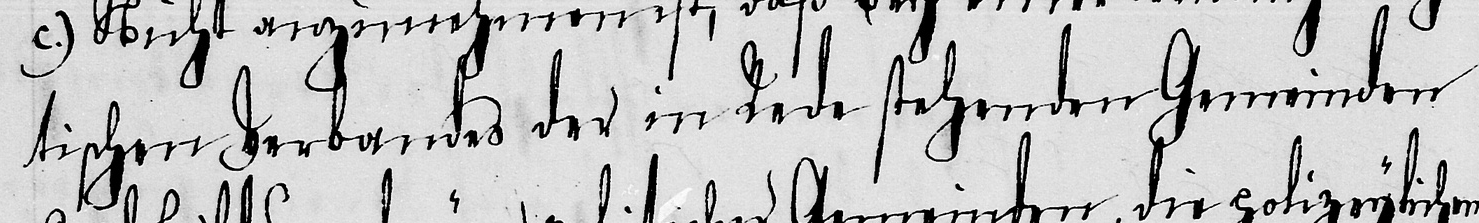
tischen Verbandes der in Rede stehenden Gemeinden
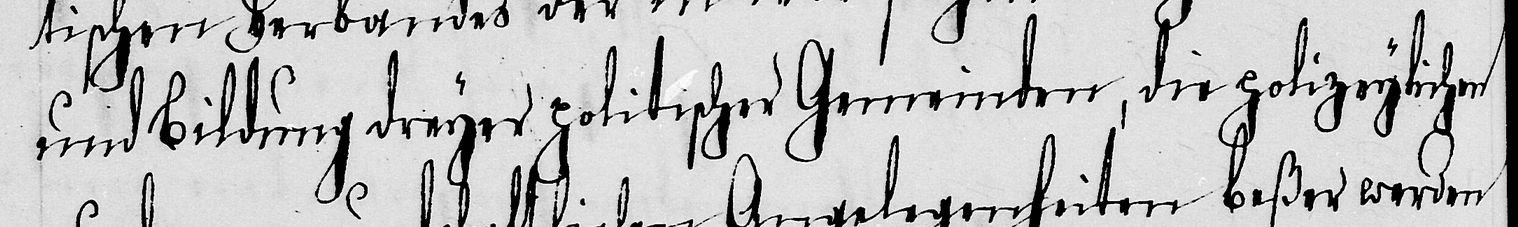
und Bildung dreyer politischer Gemeinden, die polizeylichen
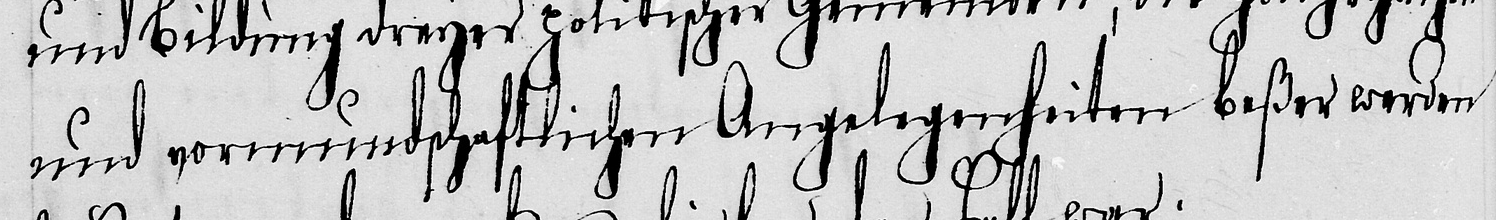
und vormundschaftlichen Angelegenheiten beßer werden
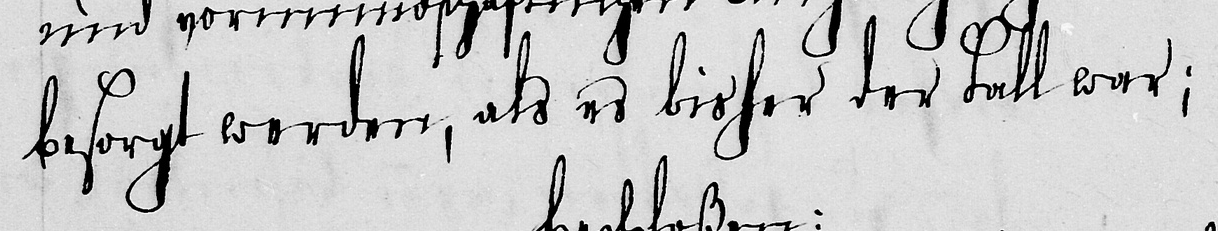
besorgt werden, als es bisher der Fall war;
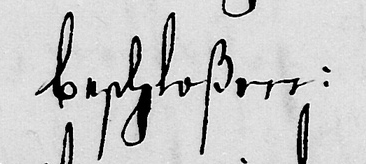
beschloßen:
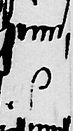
es
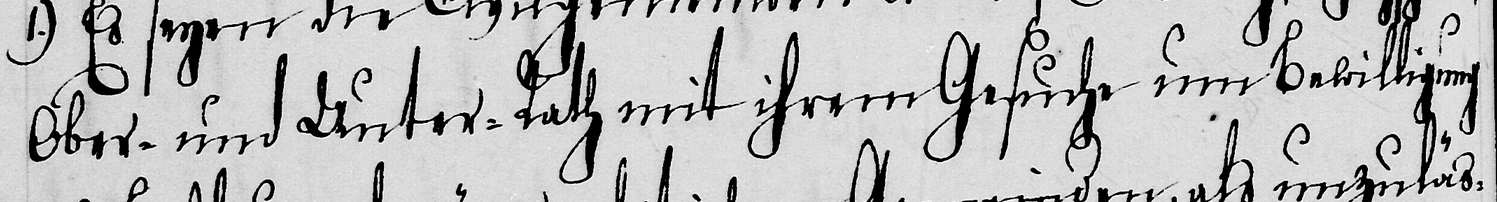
Ober- und Unter-Rath mit ihrem Gesuche um Bewillig¬
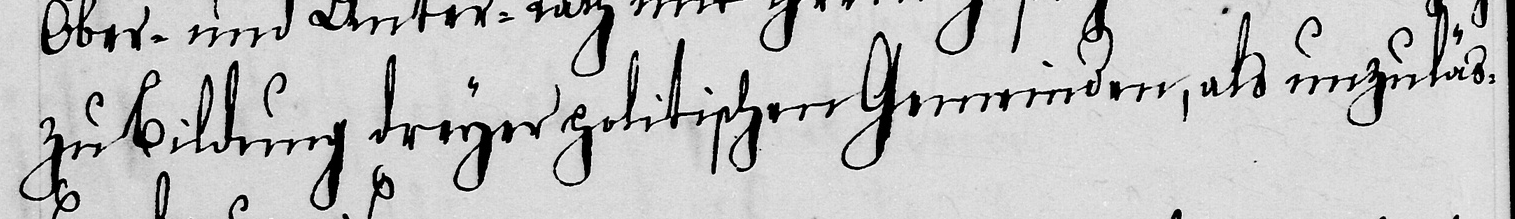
zu Bildung dreyer politischen Gemeinden, als unzuläß¬
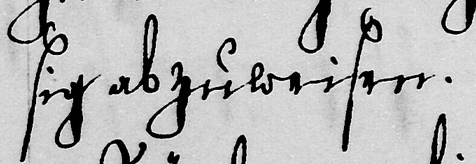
ig abzuweisen.
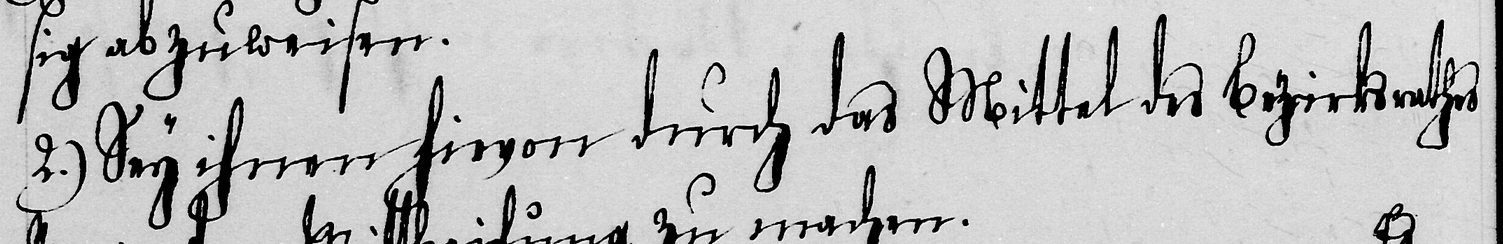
2.) Sey ihnen hievon durch das Mittel des Bezirksrath¬
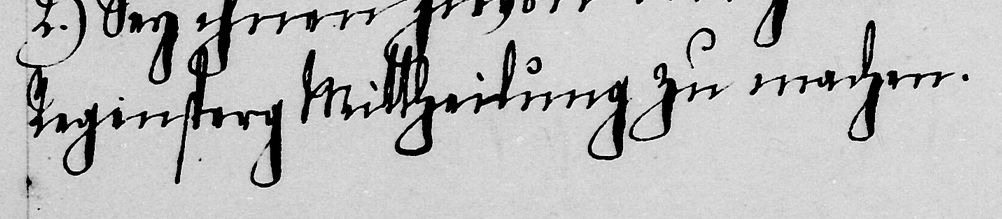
Regensberg Mittheilung zu machen.
